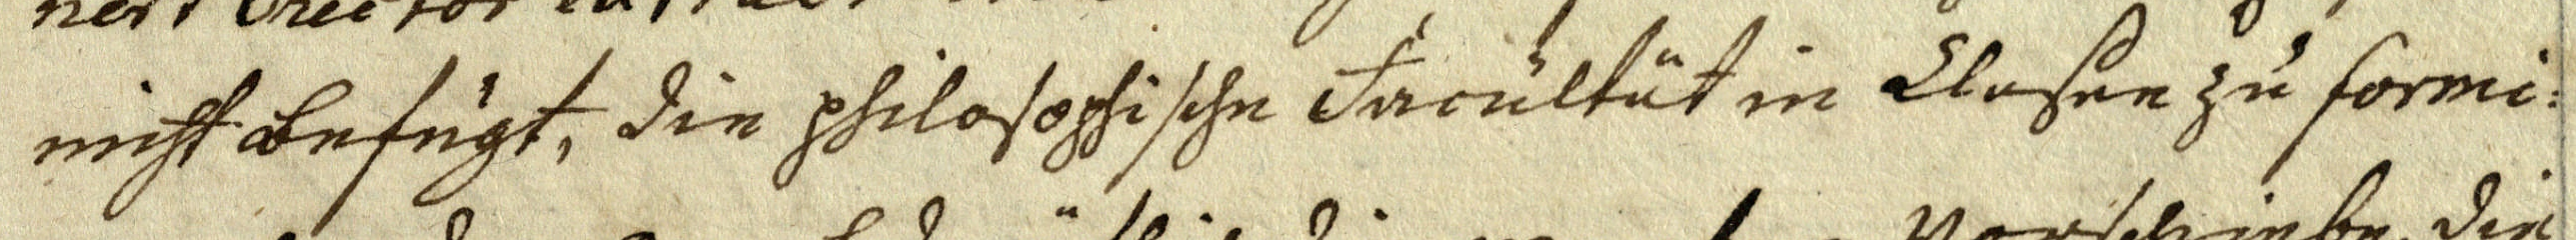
nicht befugt, die philosophische Facultät in Classen zu formi¬
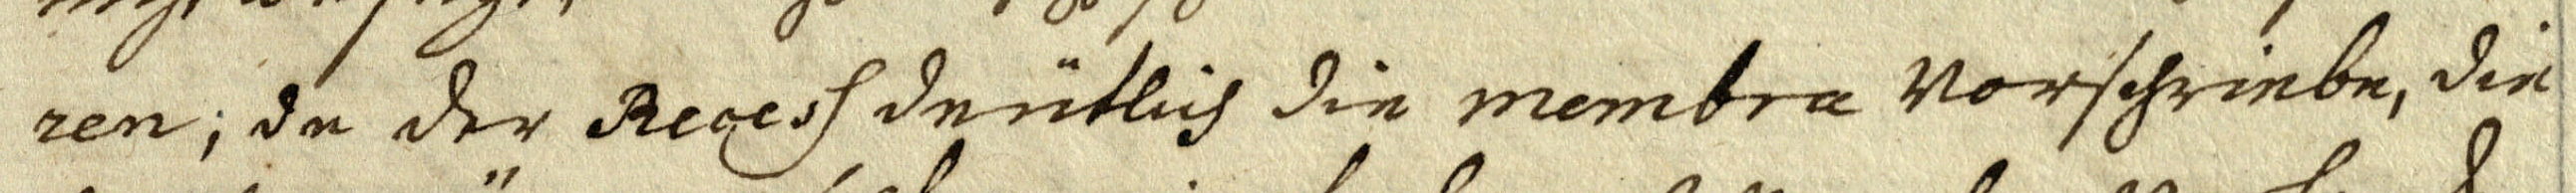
ren; da der Recess deutlich die membra vorschriebe, die
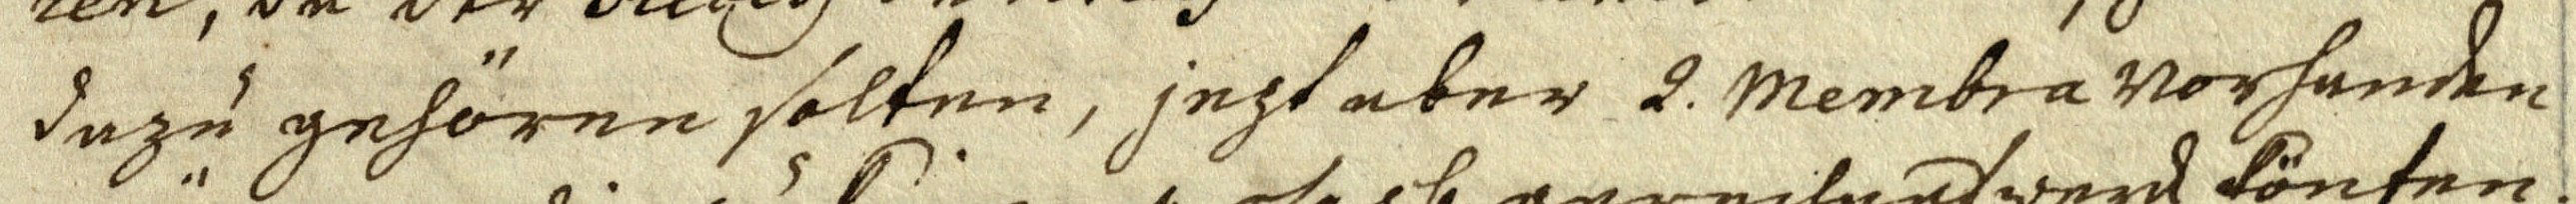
dazu gehören solten, jezt aber 2 membra vorhanden
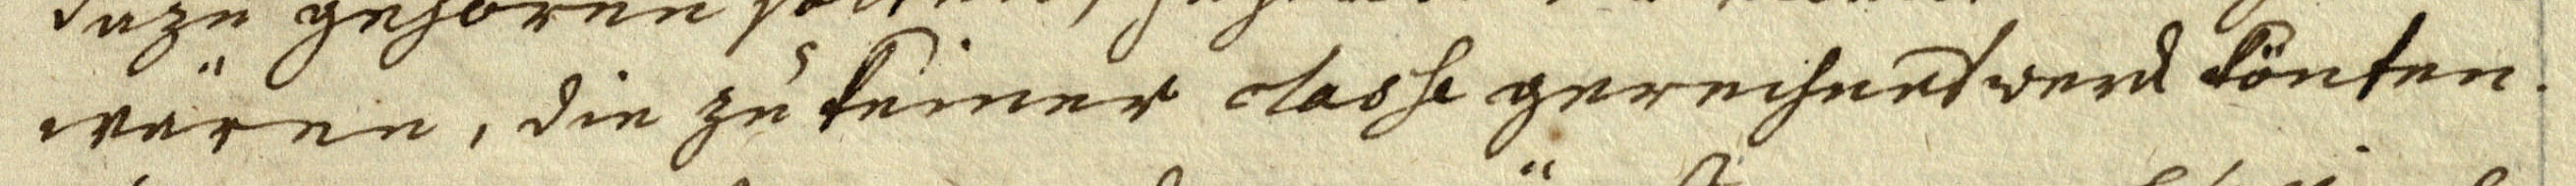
wären, die zu keiner classe gerechnet werde könten.
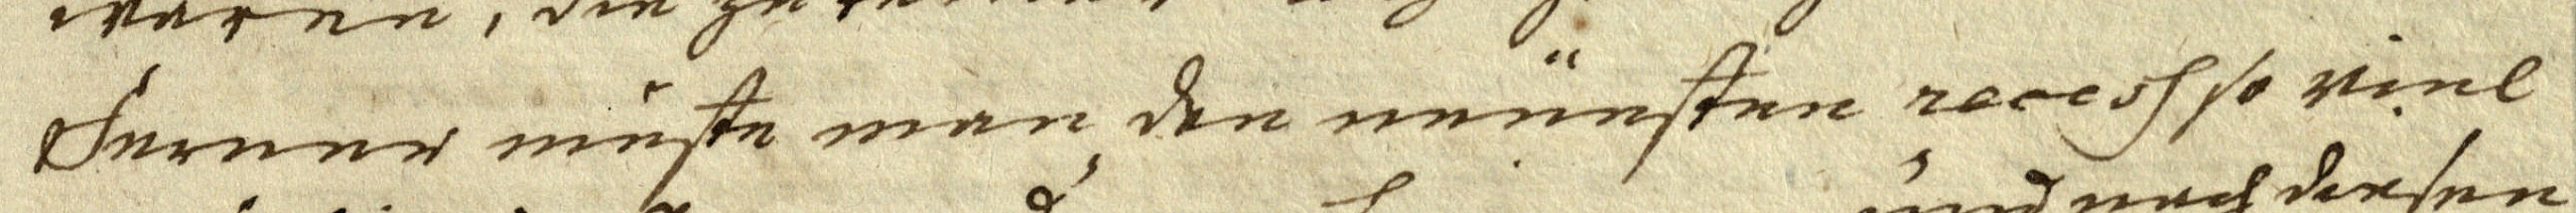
Ferner müste man den neuesten recess so viel
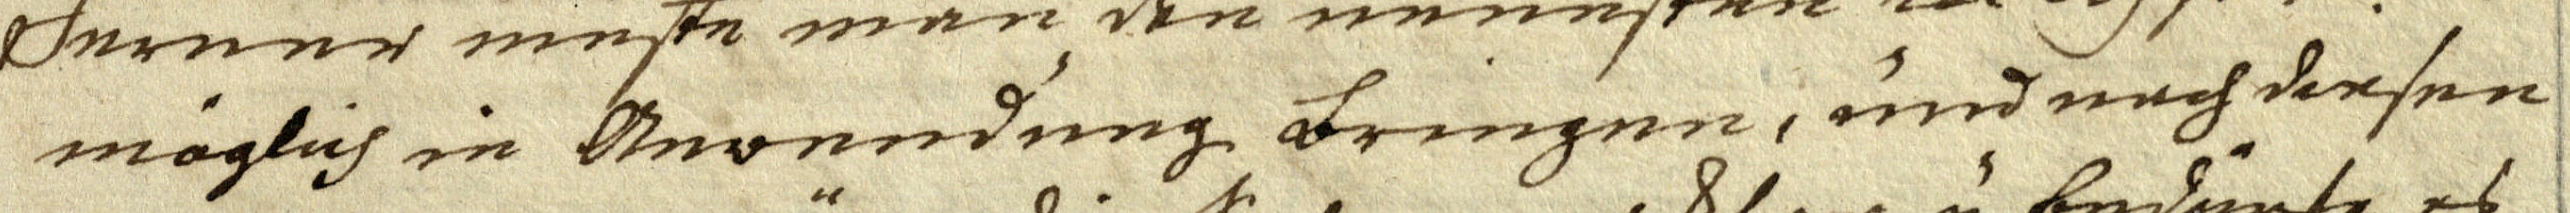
möglich in Anwendung bringen, und nach diesen
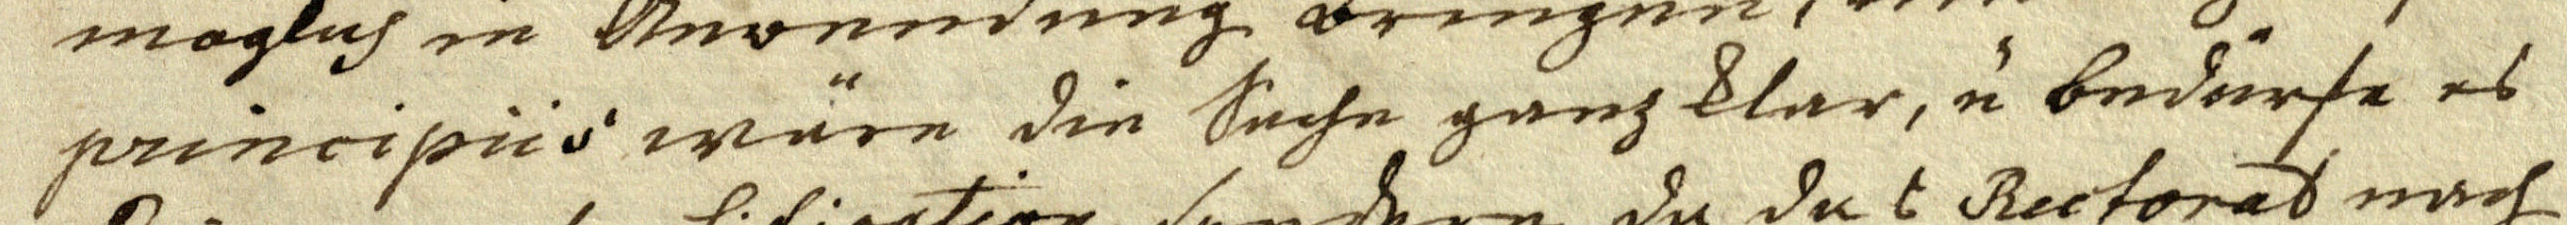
principiis wäre die Sache ganz klar,u bedürfe es
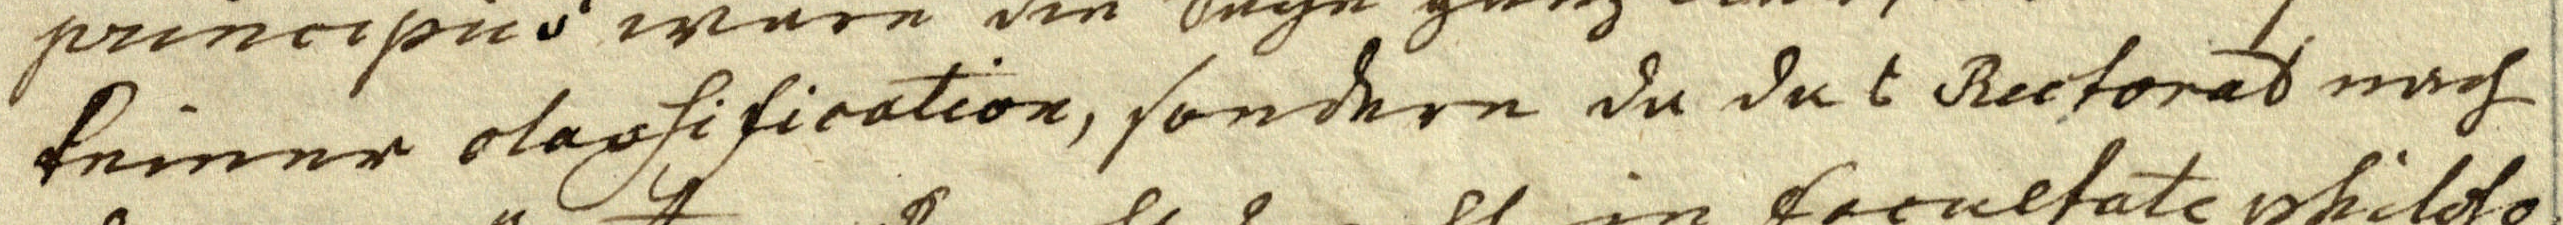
keiner classification, sondern da das Rectorat nach
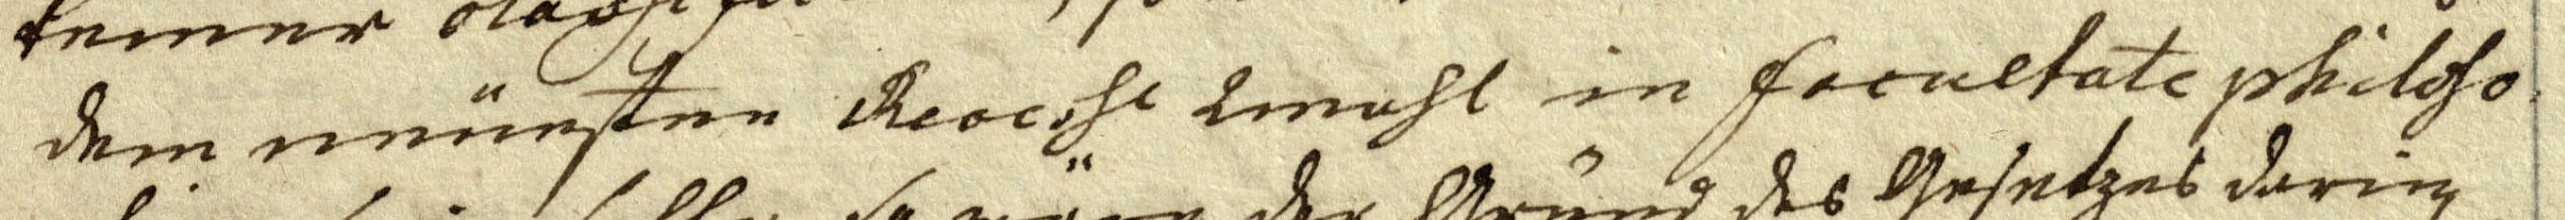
dem neuesten Recess 2mahl in Facultate philoso¬
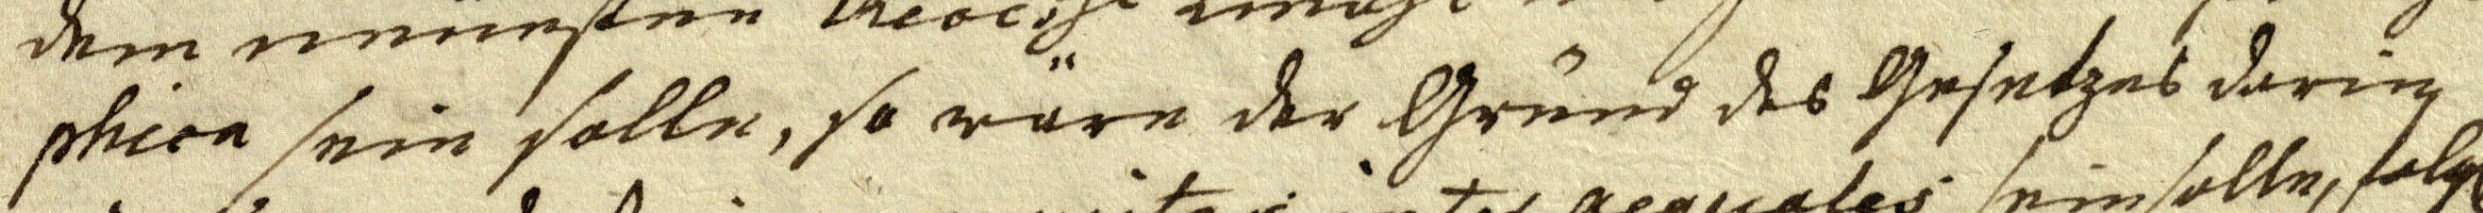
phica sein solle, so wäre der Grund des Gesetzes darin
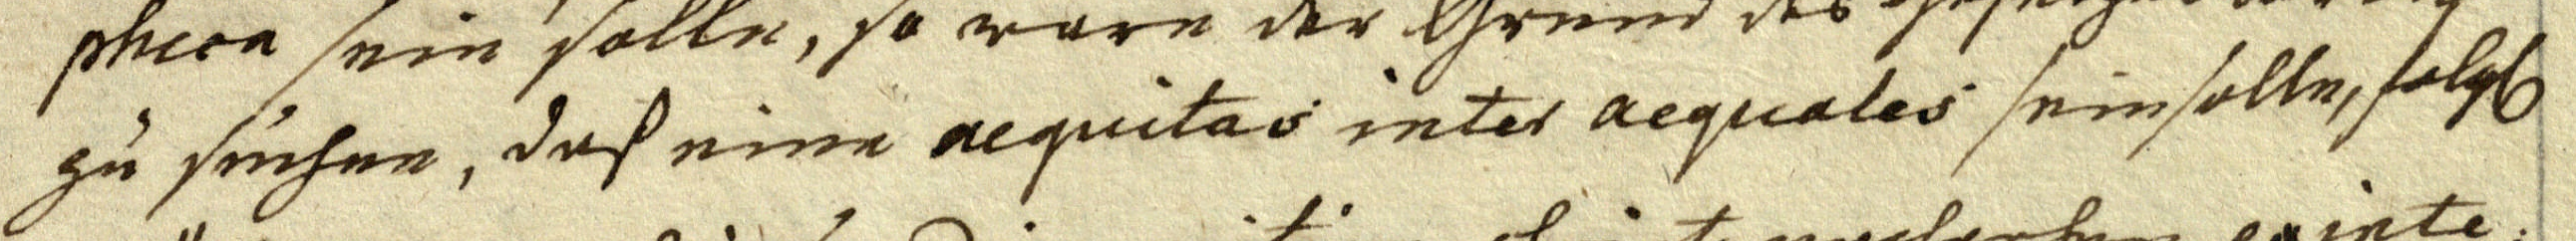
zu suchen, daß ein aequitas inter aequales sein solte, folgl.
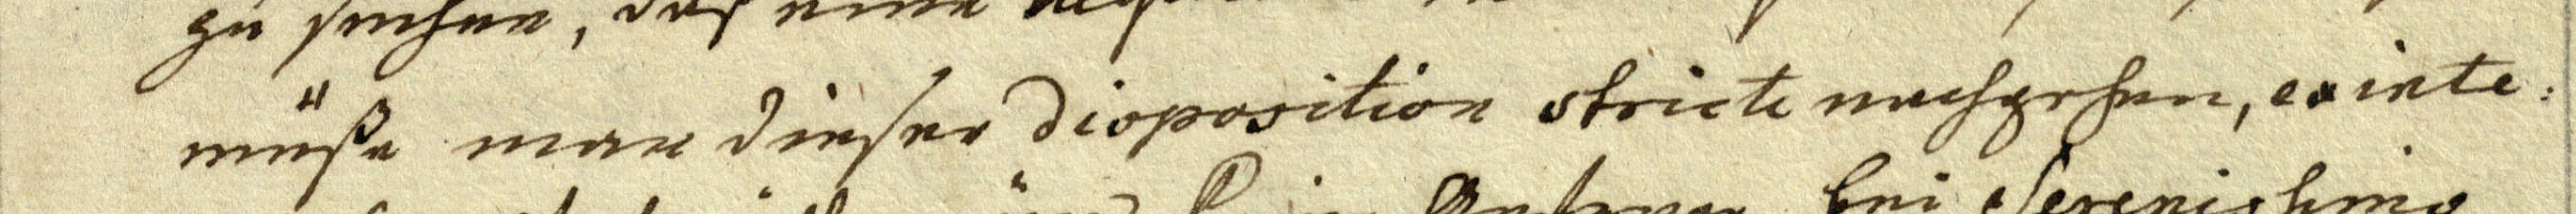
müße man dieser disposition stricte nachgeben, ex inte¬
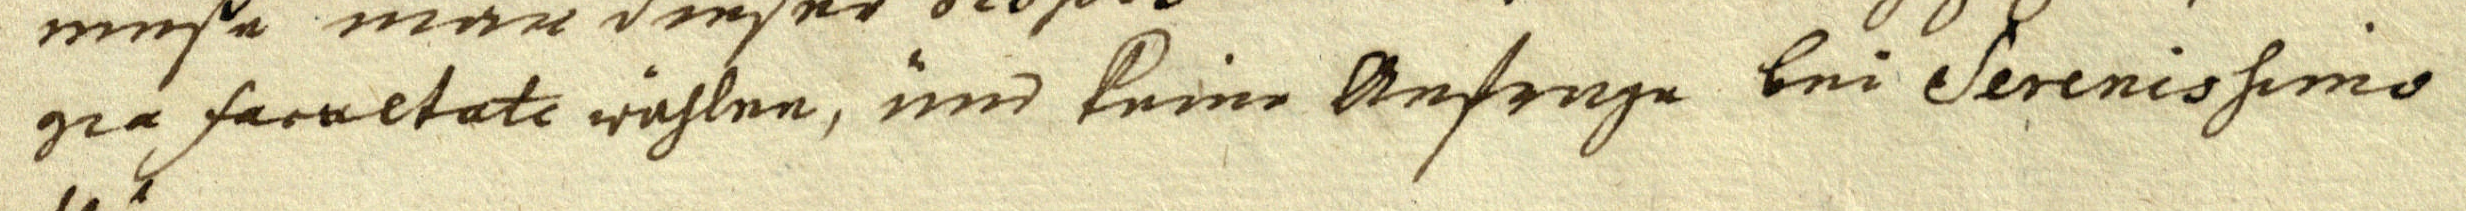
gra facultate wählen, und keine Anfrage bei Serenissimo
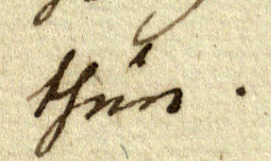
thun.
